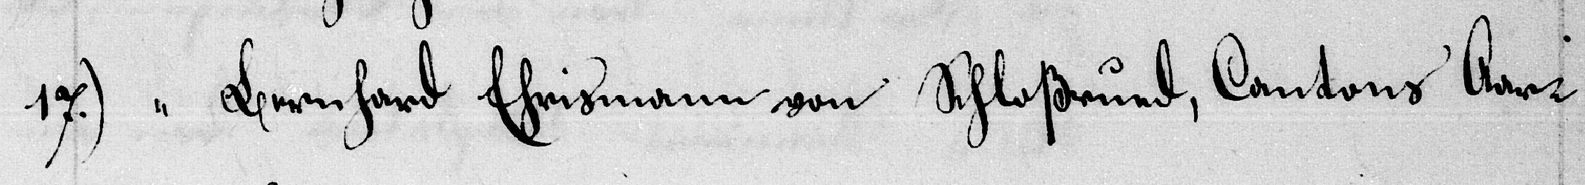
17.) “ Bernhard Ehrismann von Schloßrued, Cantons Aar¬
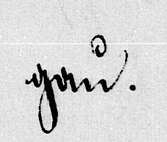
gau.
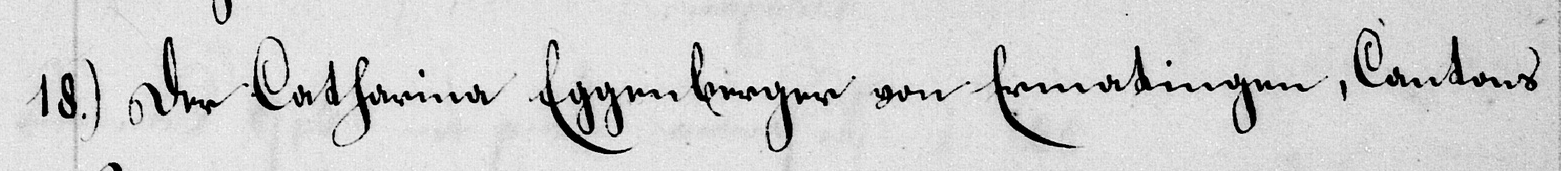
18.) Der Catharina Eggenberger von Ermatingen, Cantons
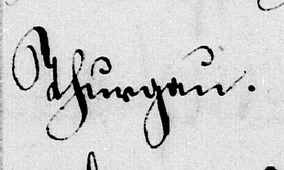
Thurgau.
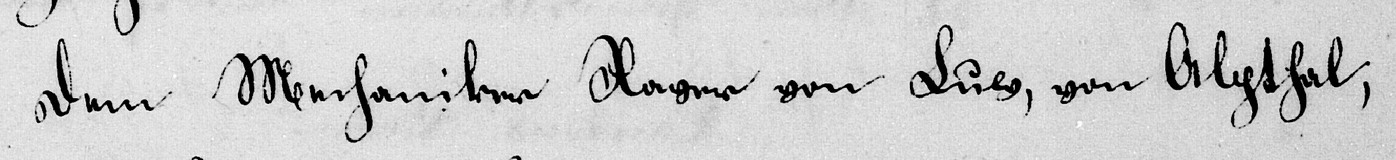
Dem Mechaniker Xaver von Luw, von Alpthal,
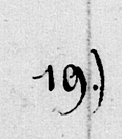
19.)
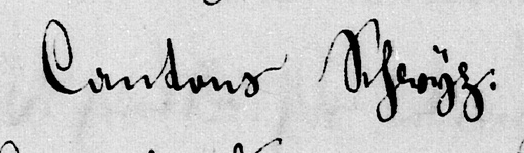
Cantons Schwyz.
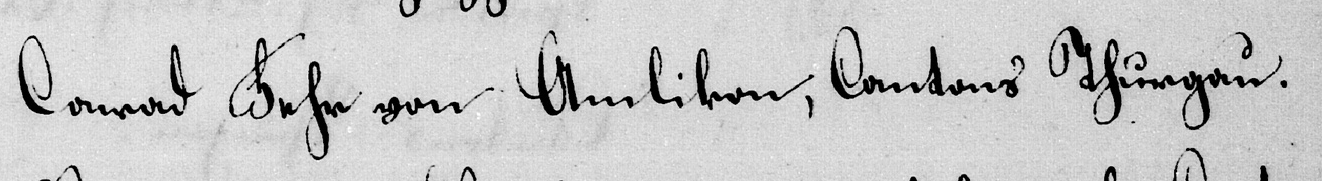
Conrad Fehr von Amlikon, Cantons Thurgau.
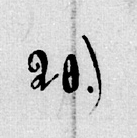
21.)
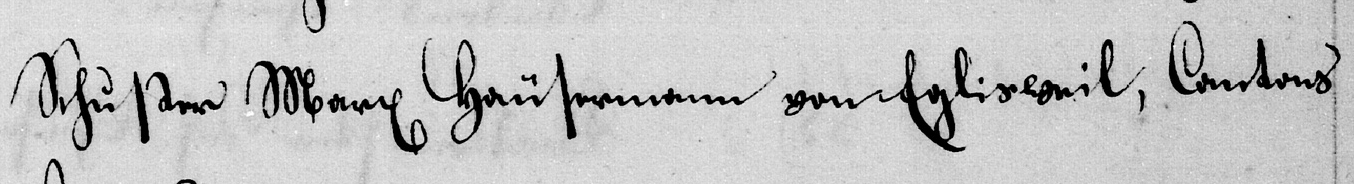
Schuster Marx Häusermann von Eglisweil, Cantons
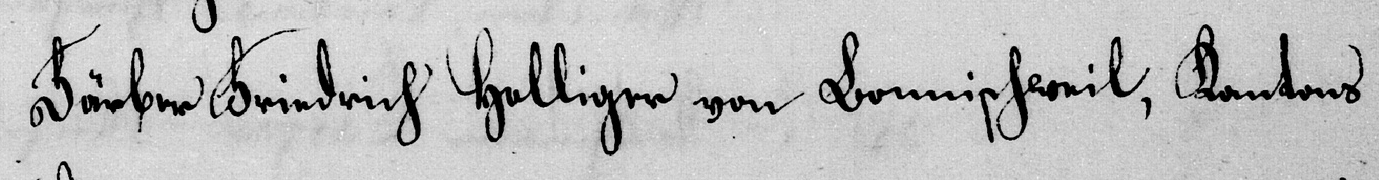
Bärber Friedrich Holliger von Bonnischweil, Kantons
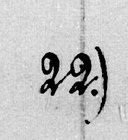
22.)
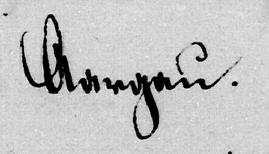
Aargau.
